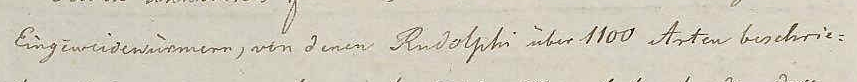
Eingeweidewürmern, von denen Rudolphi über 1100 Arten beschrie-
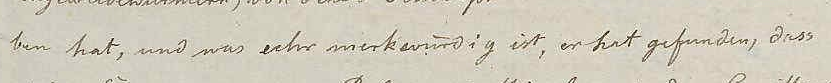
ben hat, und was sehr merkwürdig ist, er hat gefunden, dass
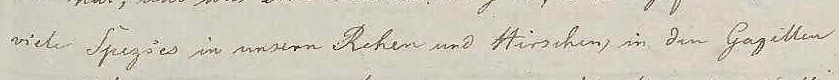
viele Spezies in unsern Rehen und Hirschen, in den Gazellen
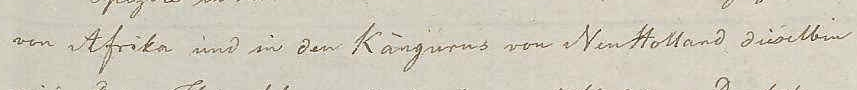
von Afrika und in den Kängurus von NeuHolland dieselben
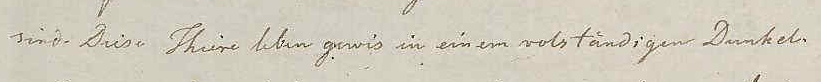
sind. Diese Thiere leben gewis in einem volständigen Dunkel.
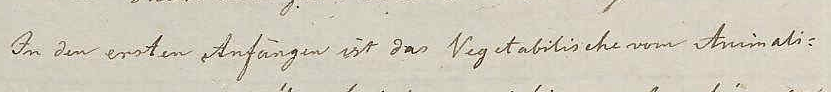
In den ersten Anfängen ist das Vegetabilische vom Animali-
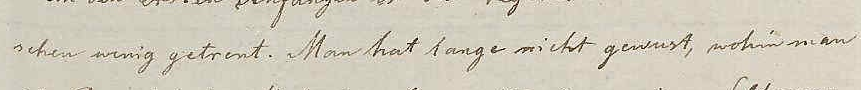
schen wenig getrent. Man hat lange nicht gewust, wohin man
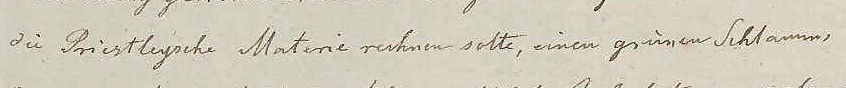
die Priestleysche Materie rechnen solte, einen grünen Schlamm,
